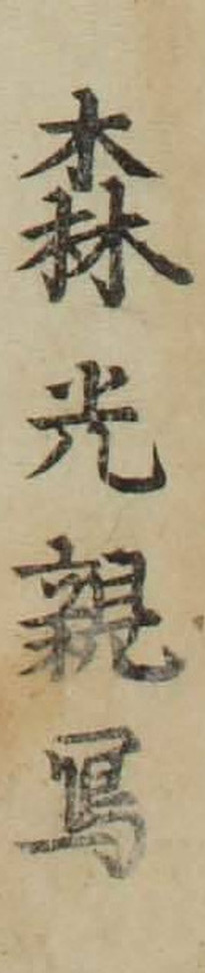森光親冩
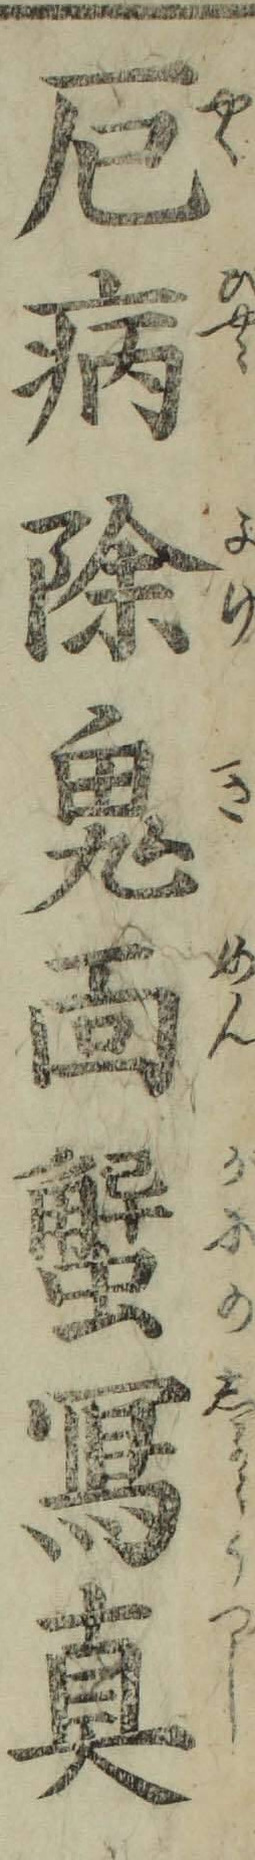厄病除鬼面蟹冩真
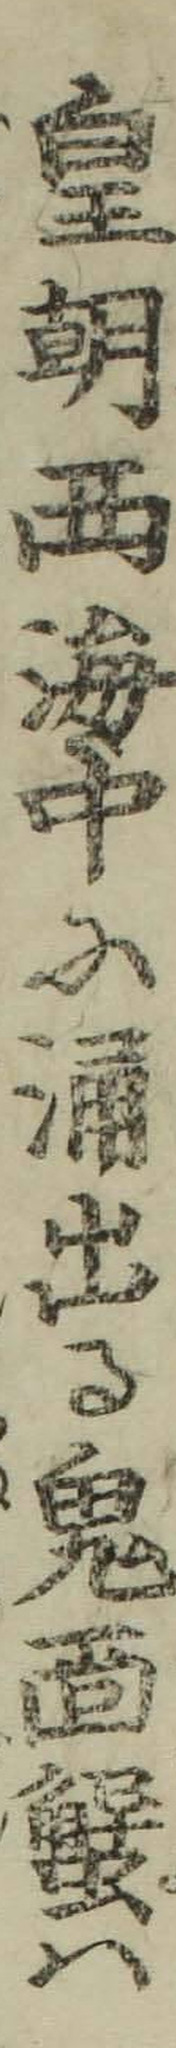皇朝西海中に湧出る鬼面蟹は
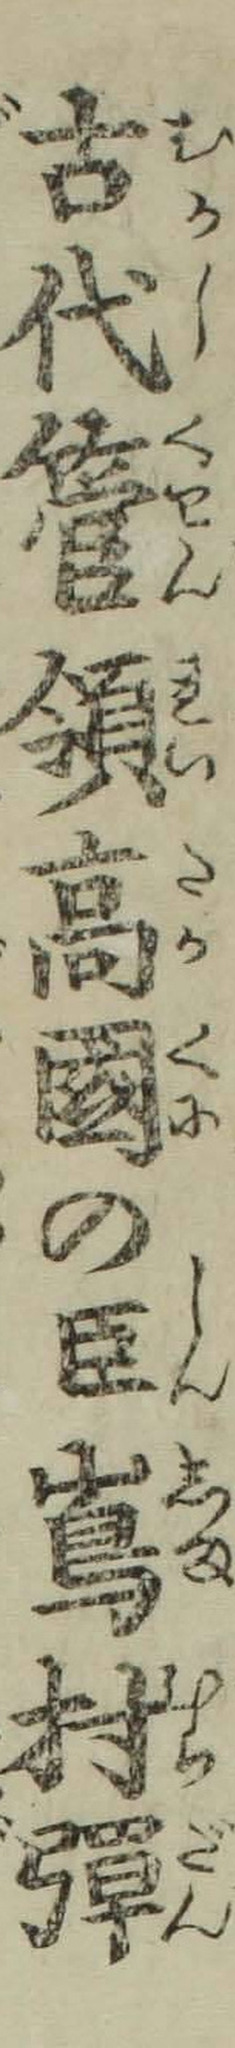古代管領高國の臣嶌村弾
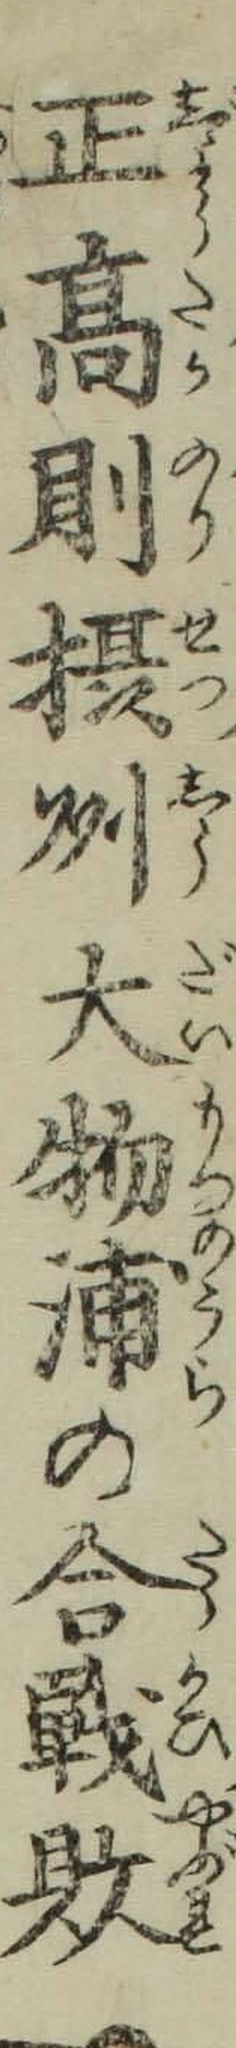正髙則摂州大物浦の合戦敗
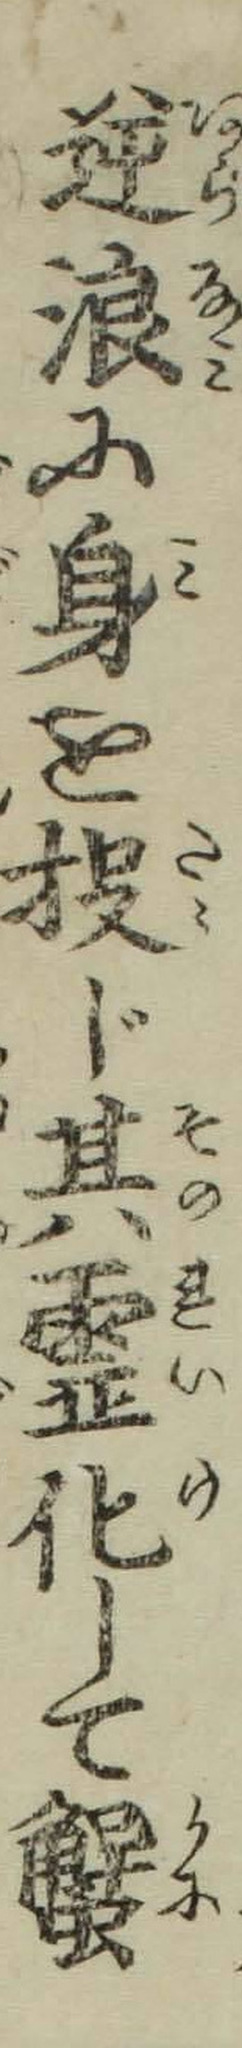逆浪に身を投じ其霊化して蟹
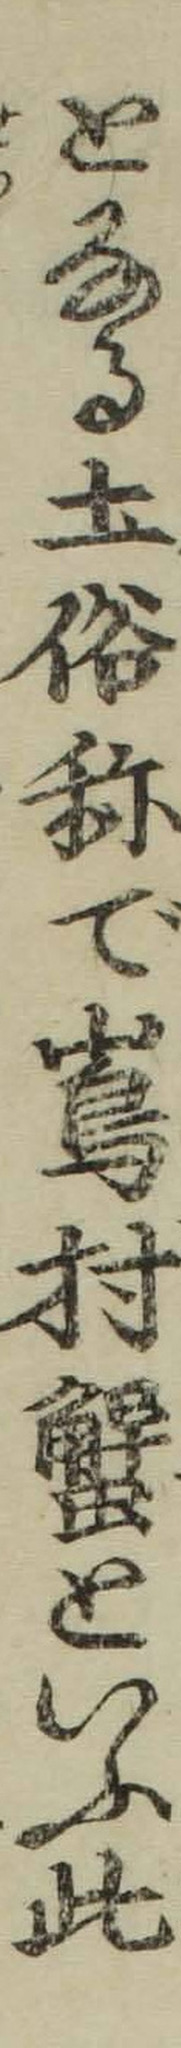となる土俗称で嶌村蟹といふ此
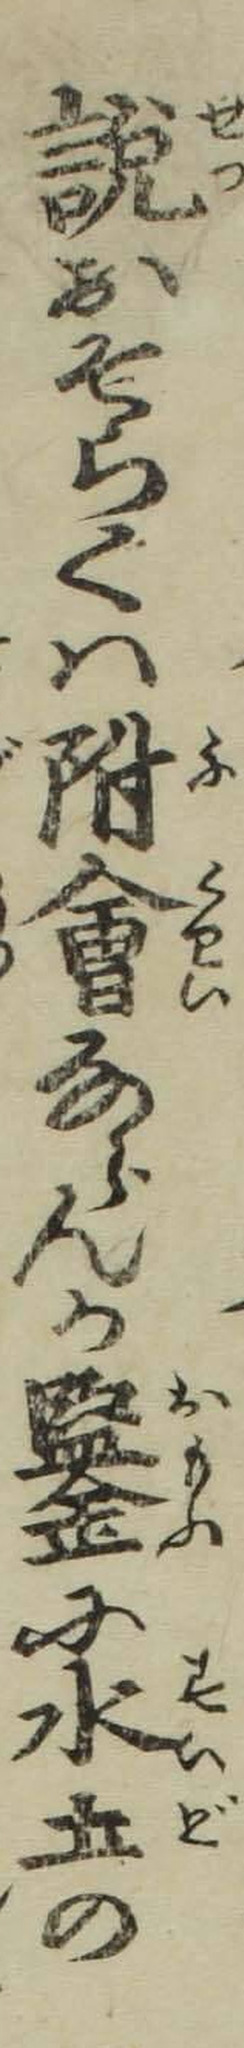説おそらくは附會ならんか鑑に水土の
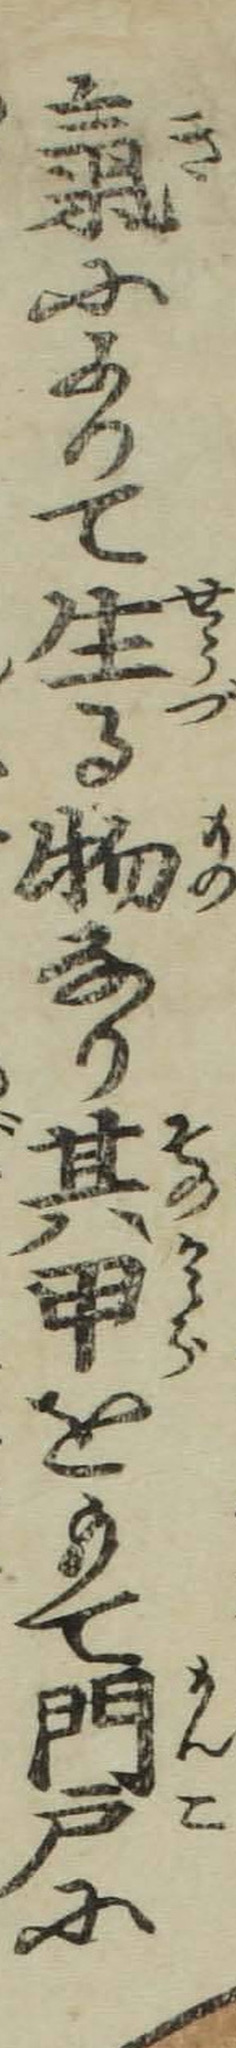気によりて生る物なり其甲をもて門戸に
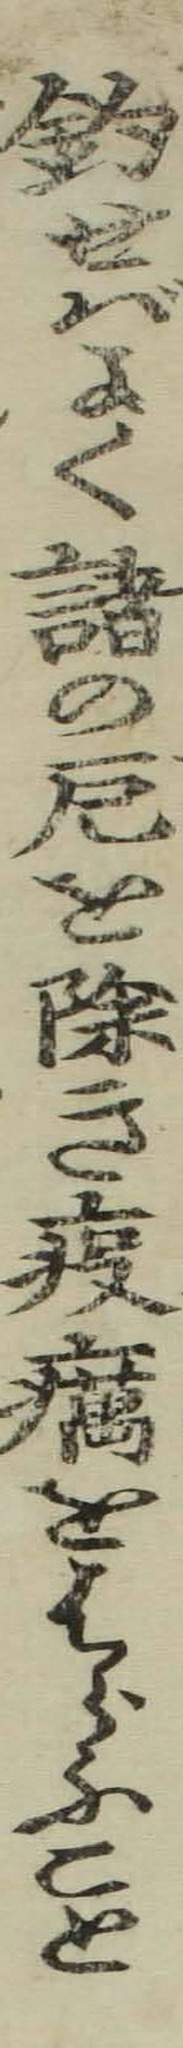釣せばよく諸の厄を除き疫癘をはらふこと
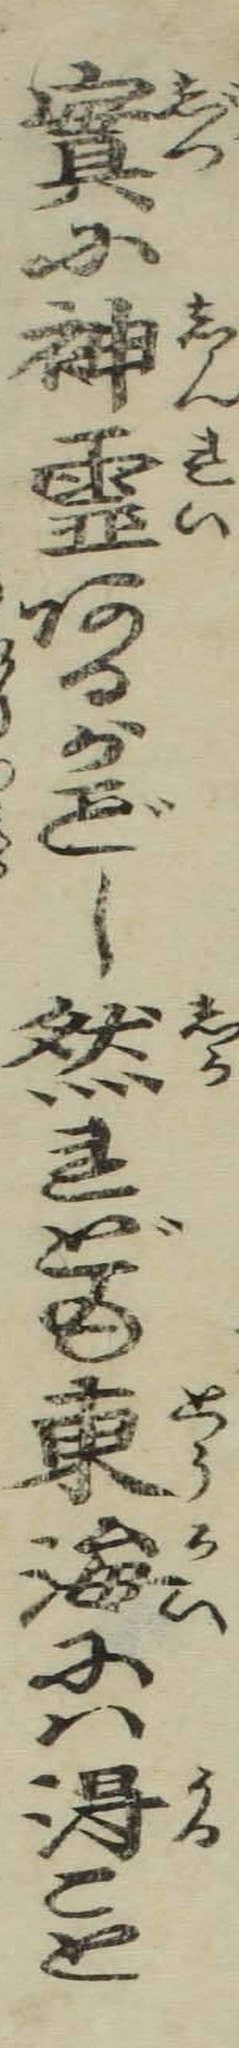實に神霊あるがごとし然れども東海には得こと
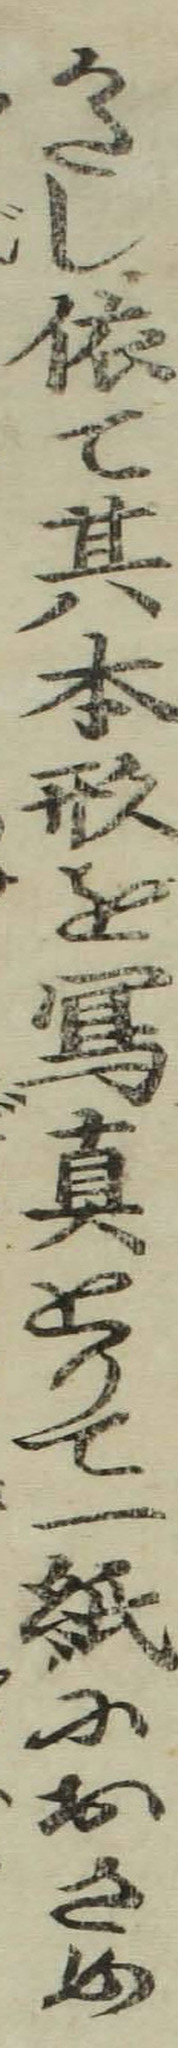かたし依て其本形を冩真とりて一紙におさめ
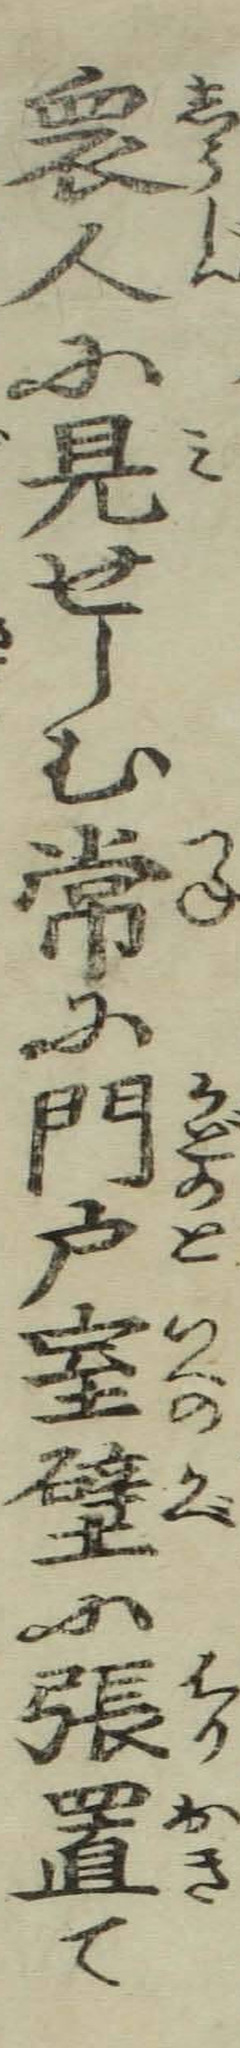衆人に見せしむ常に門戸室壁に張置て
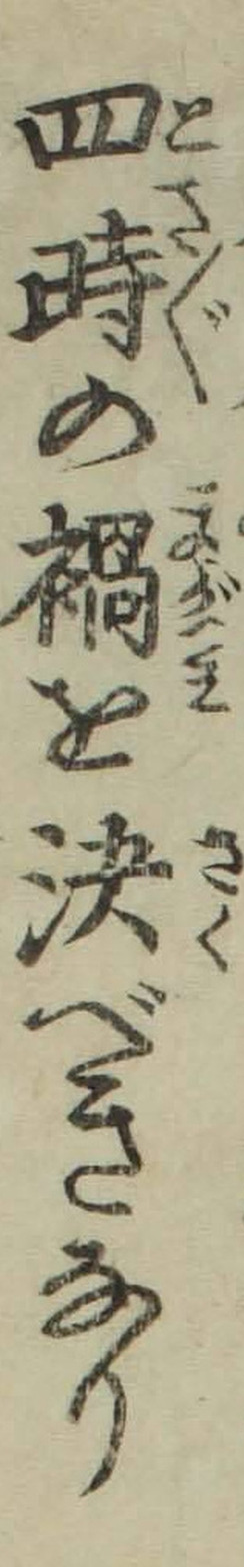四時禍を決べきなり
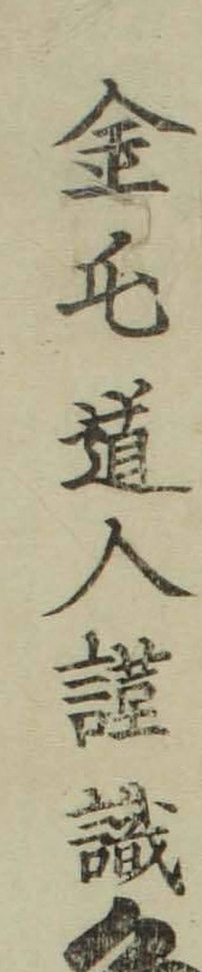金屯道人謹識
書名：厄病除鬼面蟹冩真
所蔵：国文学研究資料館
